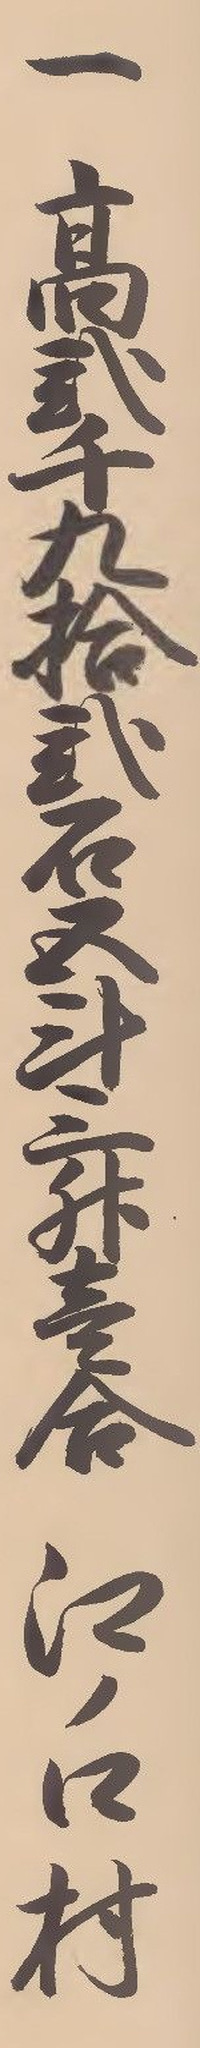一髙弐千九拾弐石五斗三升壱合江ノ口村
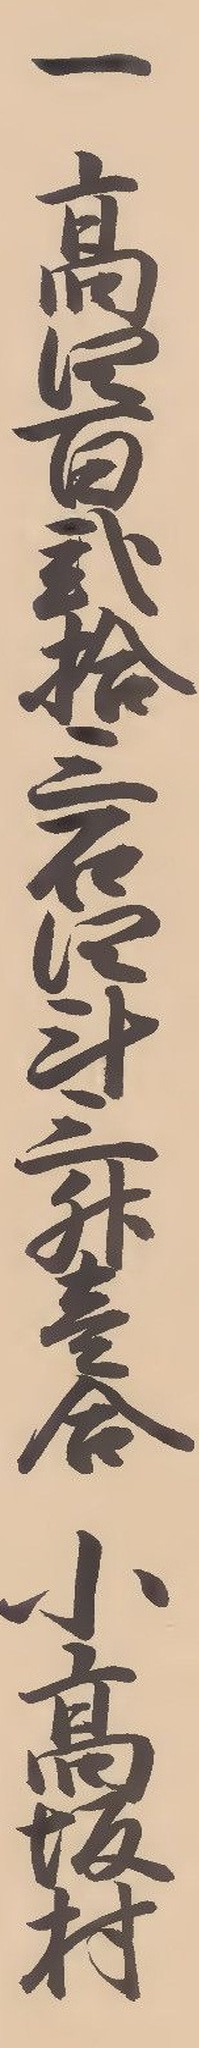一髙四百弐拾三石四斗弐升壱合小髙坂村
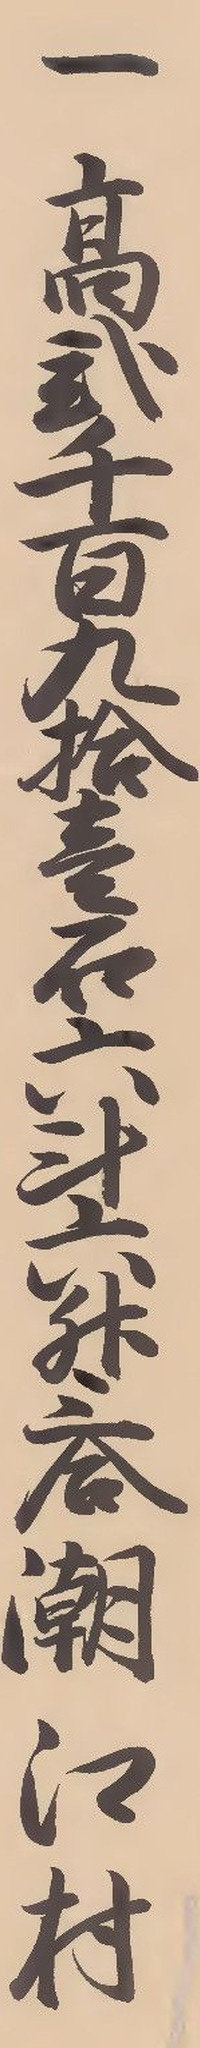一髙弐千百九拾壱石六斗六升弐合潮江村
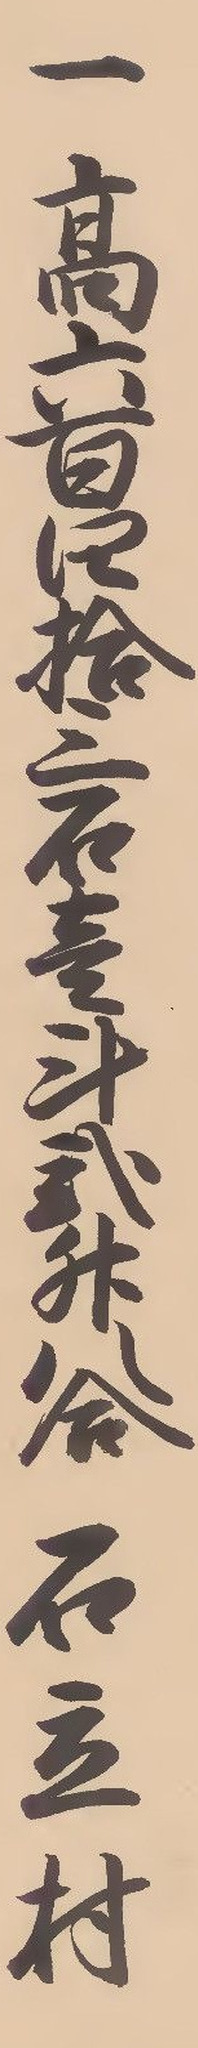一髙六百四拾三石壱斗弐升八合石立村

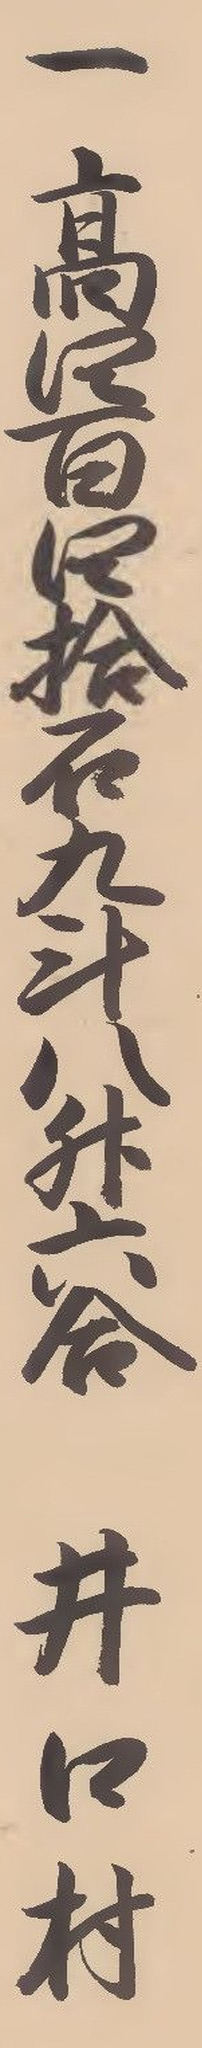一髙四百四拾石九斗八升六合井口村
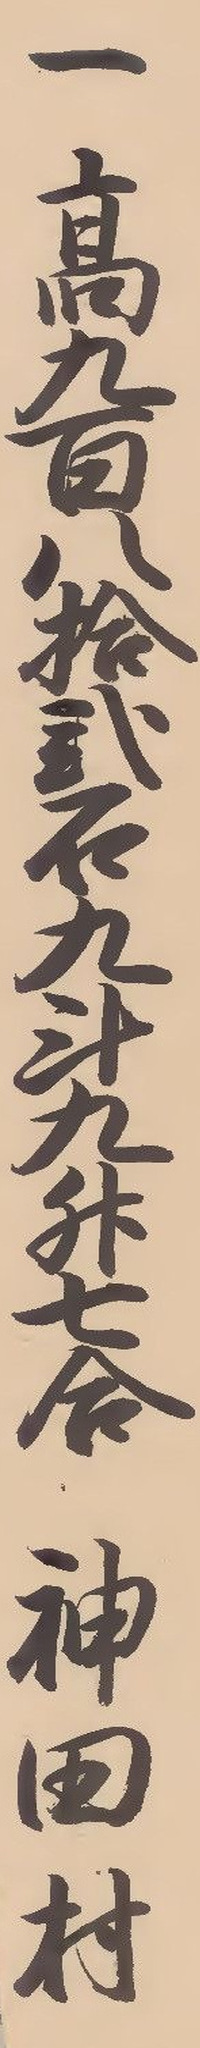一髙九百八拾弐石九斗九升七合神田村
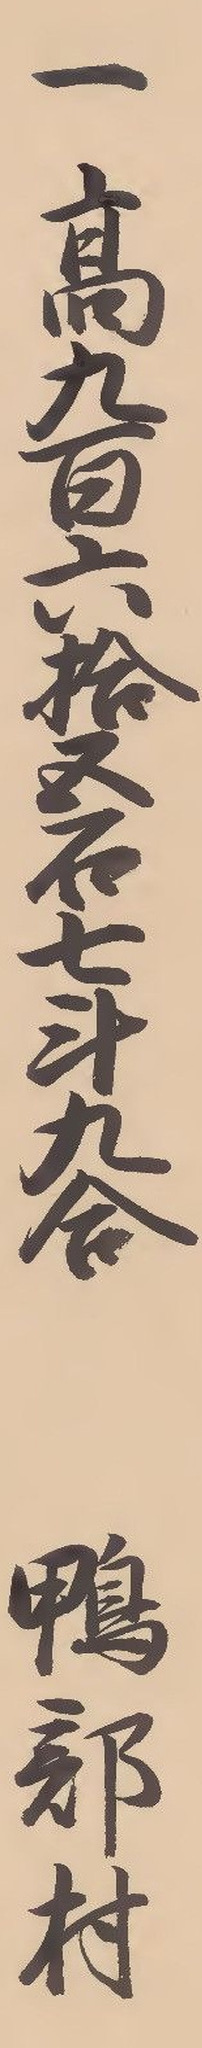一髙九百六拾五石七斗九合鴨部村
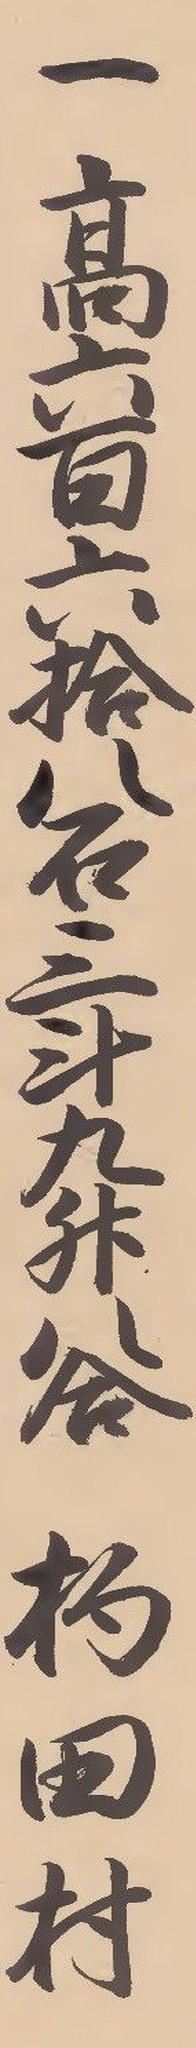一髙六百六拾八石三斗九升八合杓田村
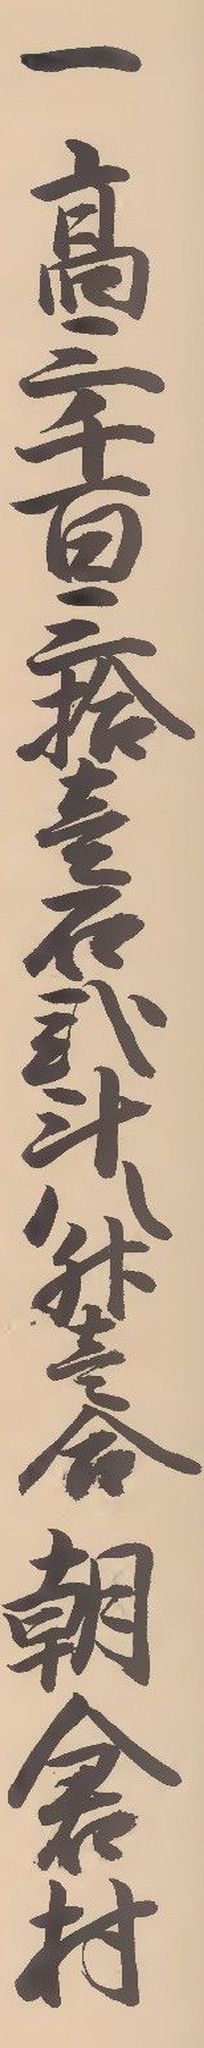一髙三千百三拾壱石弐斗八升壱合朝倉村
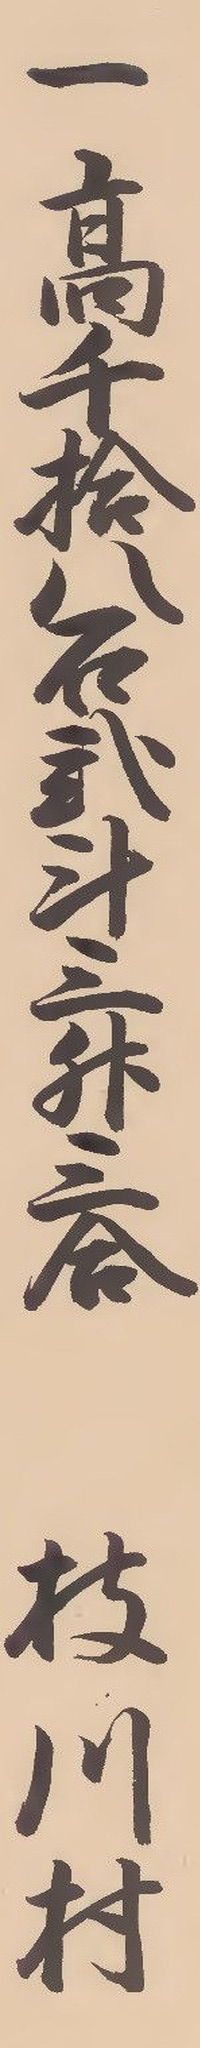一髙千拾八石弐斗三升三合枝川村
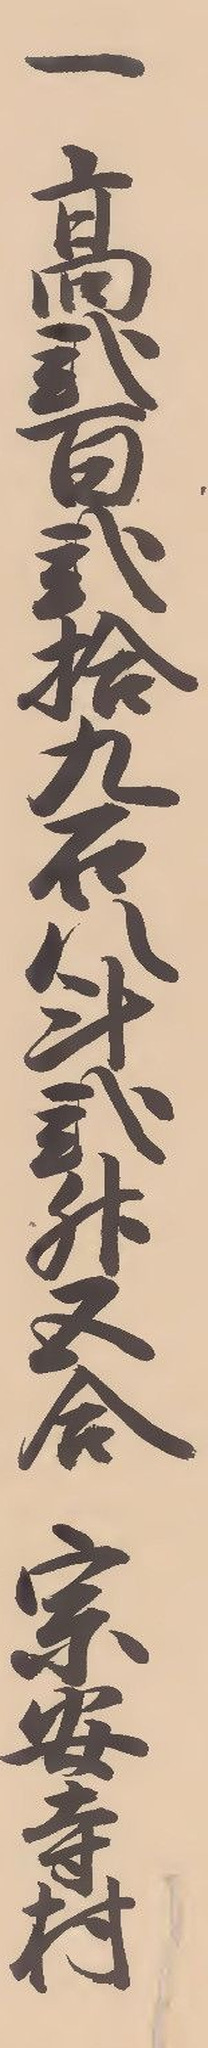一髙弐百弐拾九石八斗弐升五合宗安寺村
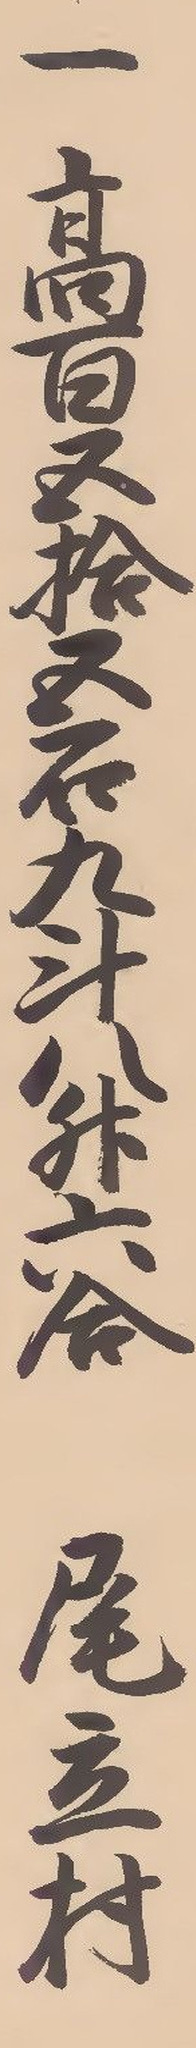一髙百五拾五石九斗八升六合尾立村

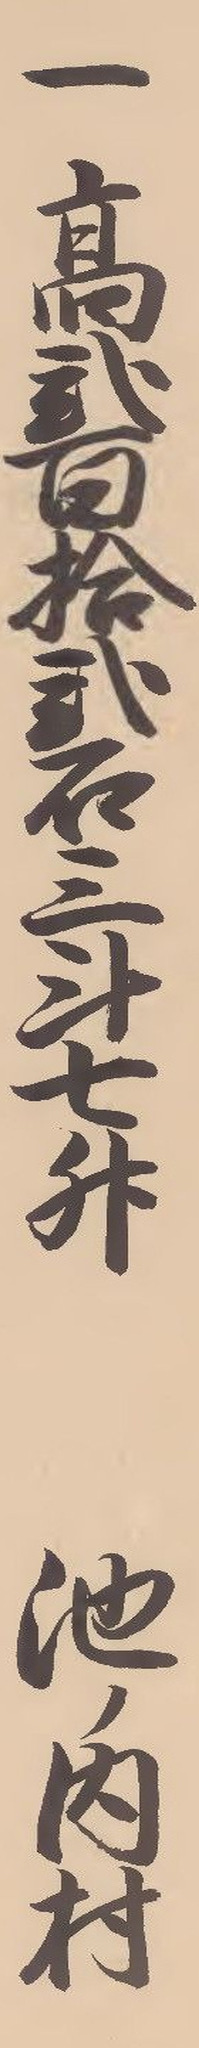一髙弐百拾弐石三斗七升池ノ内村
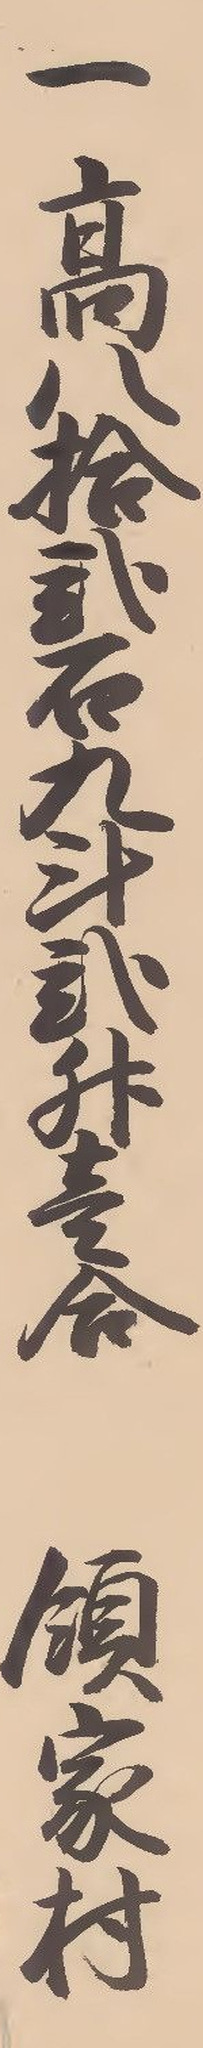一髙八拾弐石九斗弐升壱合領家村
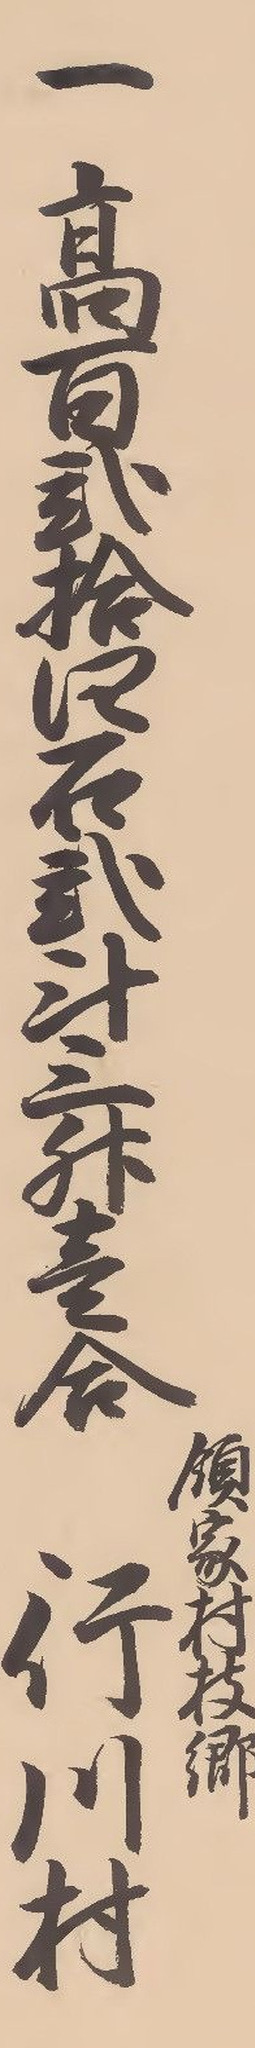一髙百弐拾四石弐斗三升壱合行川村
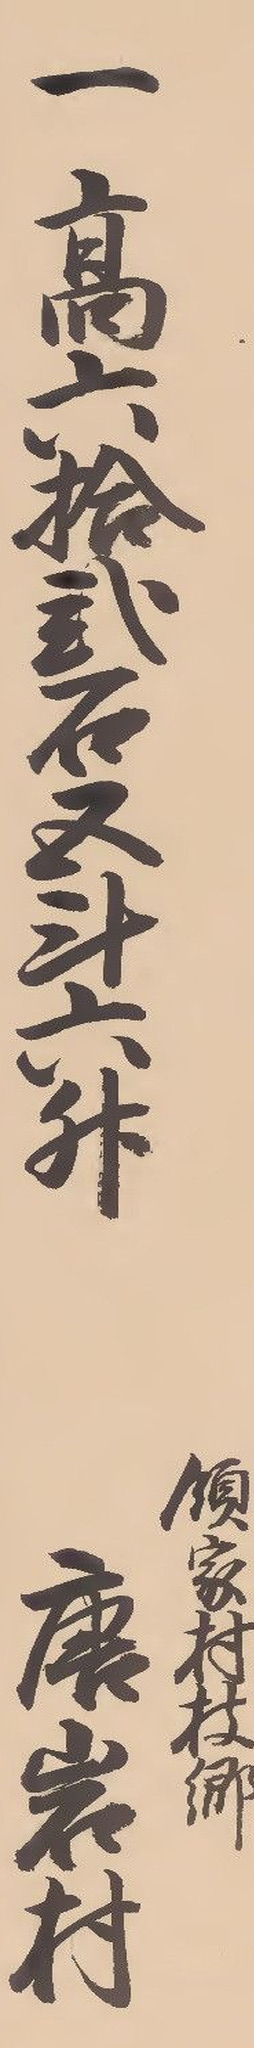一髙六拾弐石五斗六升唐岩村
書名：土佐国郷帳
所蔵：国立公文書館 National Archives of Japan
